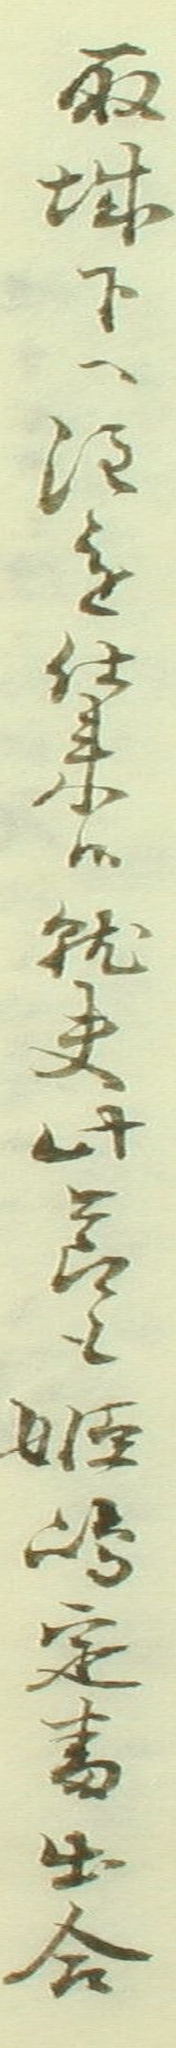取城下へ注進仕来候就其此節も姫島定番出合
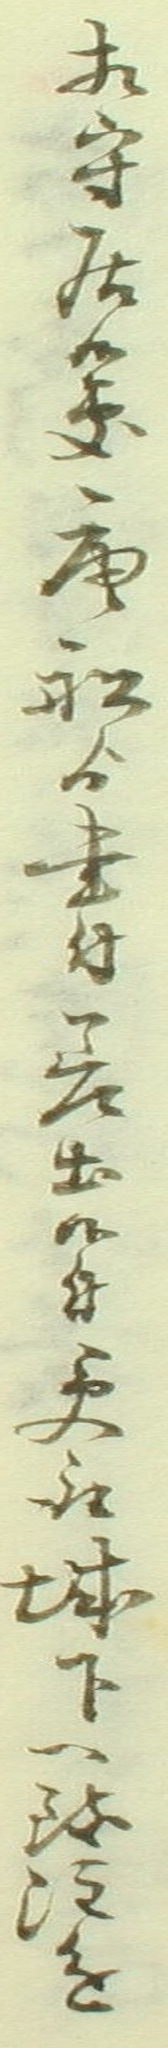相守居候処唐船ゟ書付差出候付受取城下へ致注進
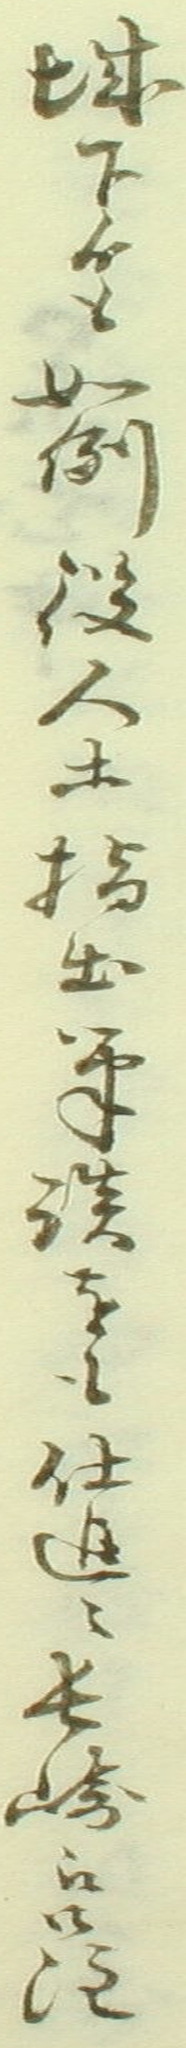城下ゟも如例役人等指出筆談をも仕追々長崎え御注
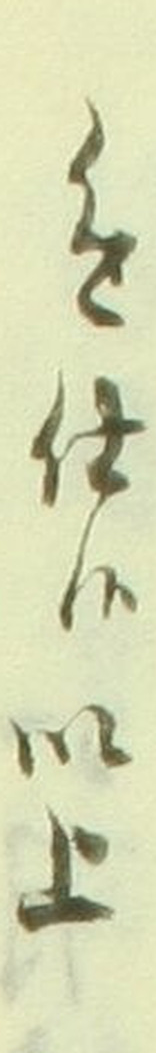進仕候以上
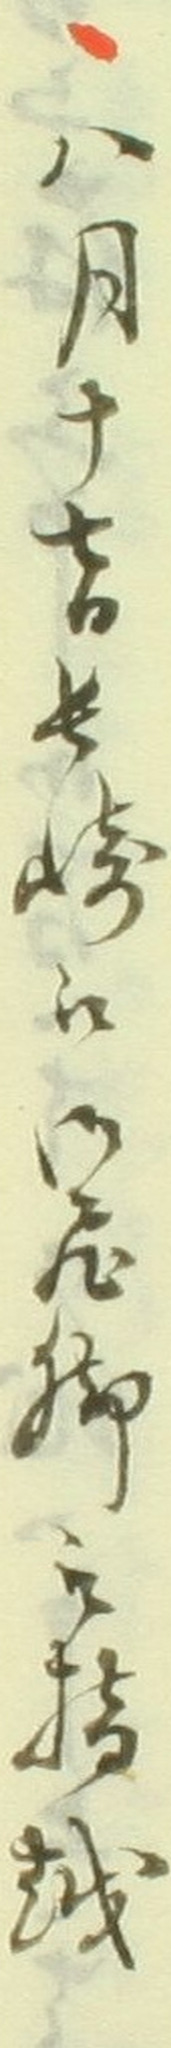八月十七日長崎え御飛脚被指越
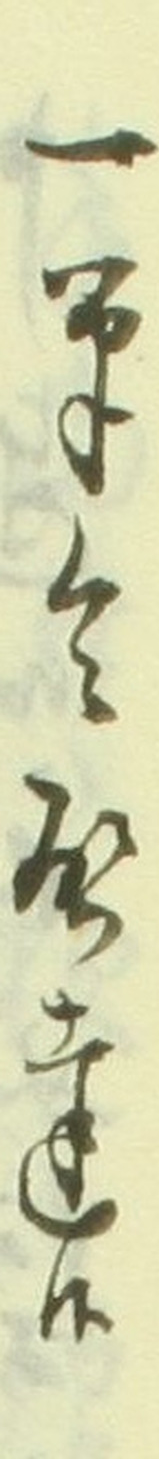一筆令啓達候
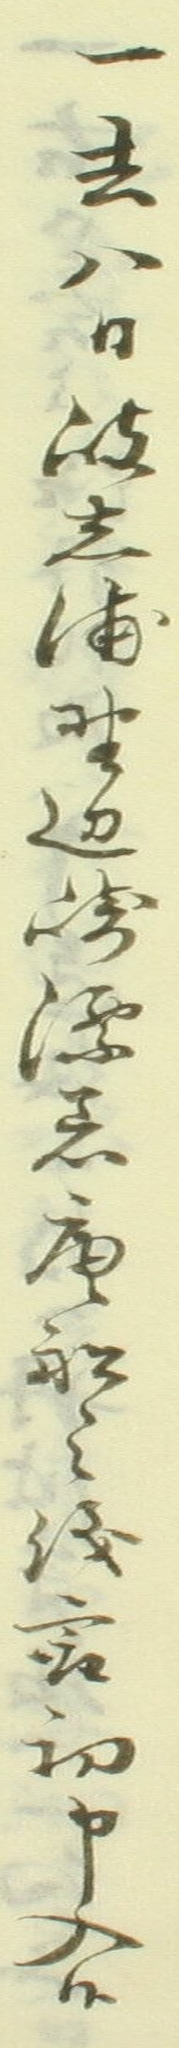一去八日岐志浦野辺崎漂着唐船之儀最初申入候
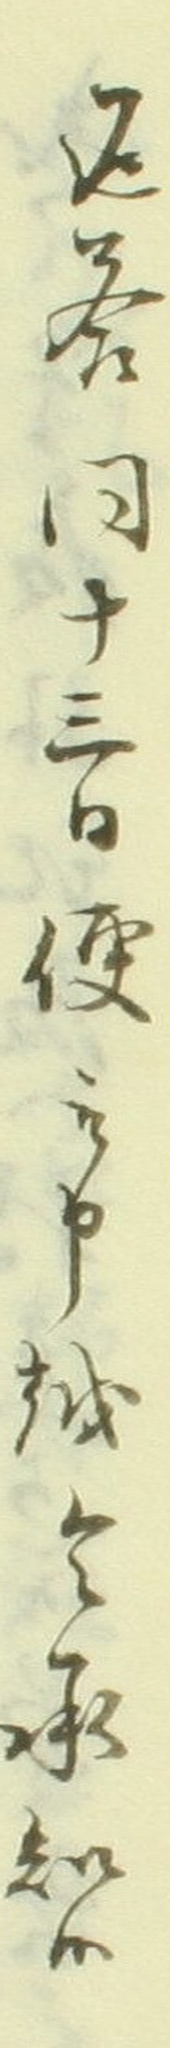返答同十三日便被申越令承知候
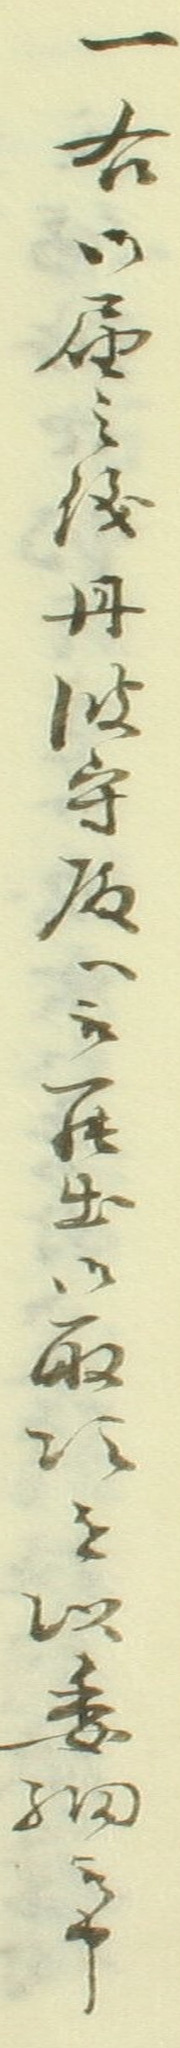一右御届之儀丹波守殿へ被罷出御取次を以委細被申
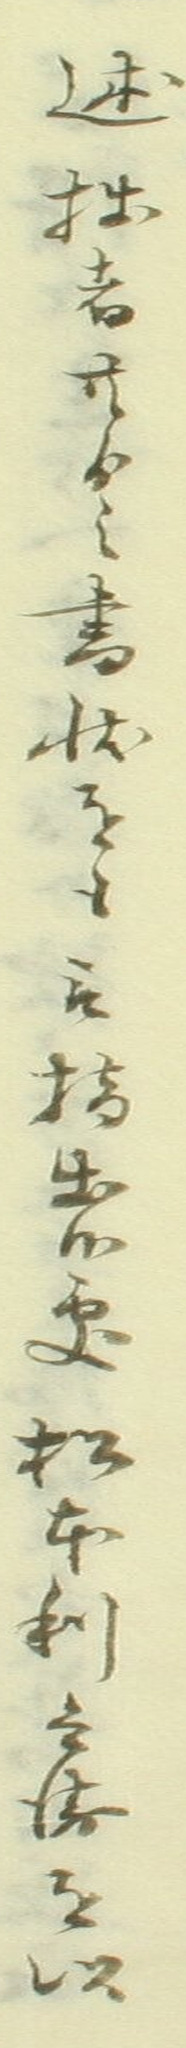述拙者共ゟ之書状をも被指出候処松本利兵衛を以
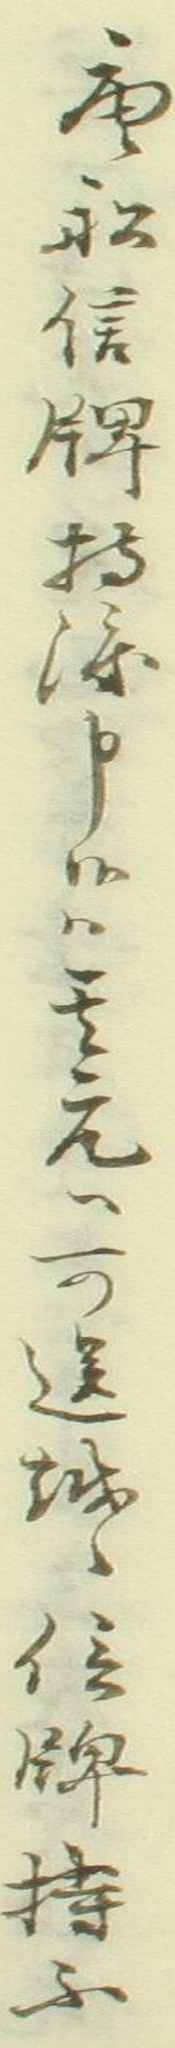唐船信牌持渡申候は其元へ可送越候信牌持不
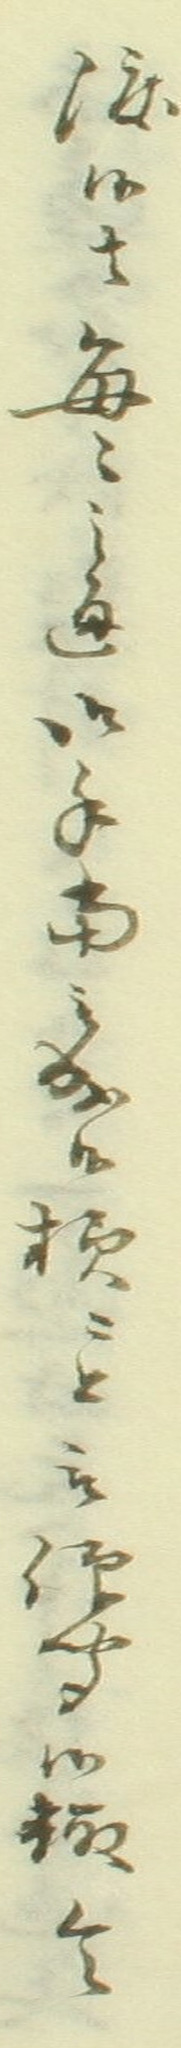渡候は毎々之通御手当に成候様にと被仰聞候掫令
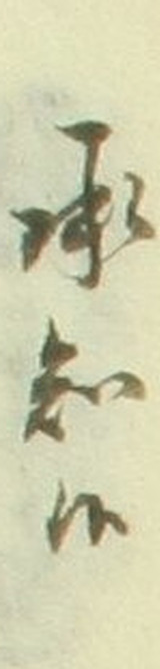承知候
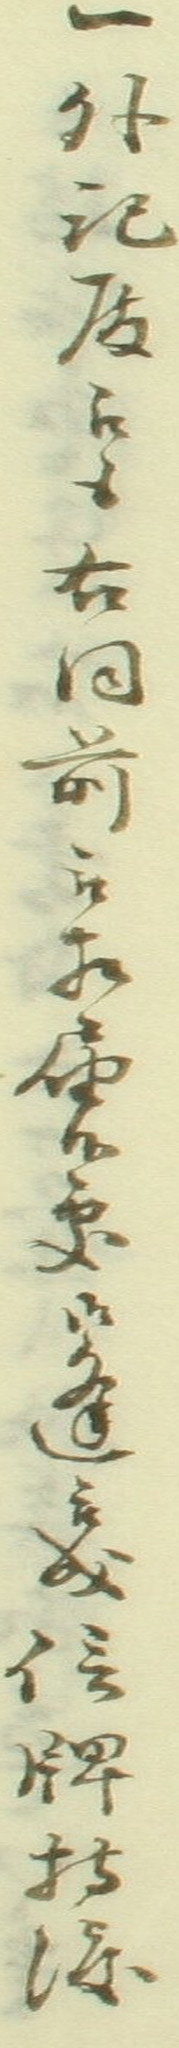一外記殿えも右同前被相届候処御逢被成信牌持渡
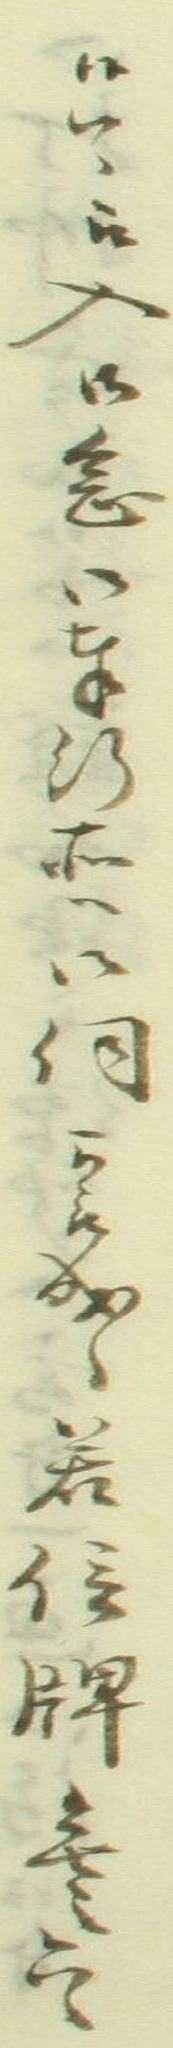候はゝ被入御念御奉行所へ御伺可被成候若信牌無之候はゝ

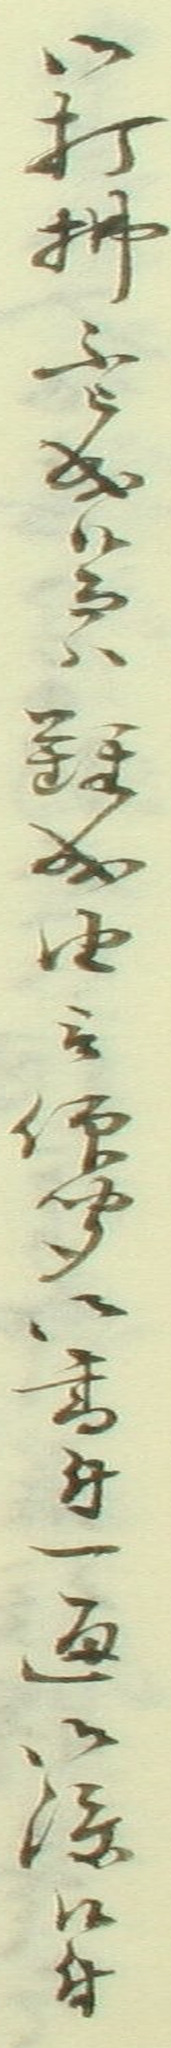御打払不被成候而は難成由被仰聞御書付一通御渡候付
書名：異国船漂着記
